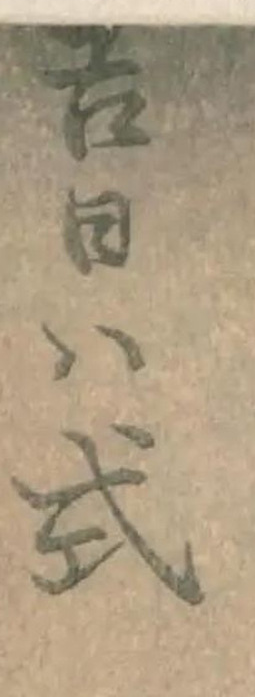吉日は式
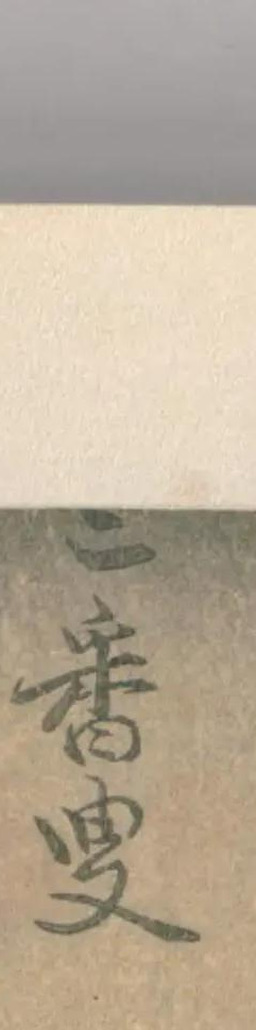三番叟
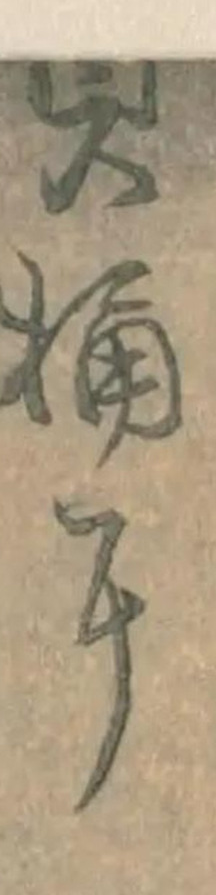貝桶に
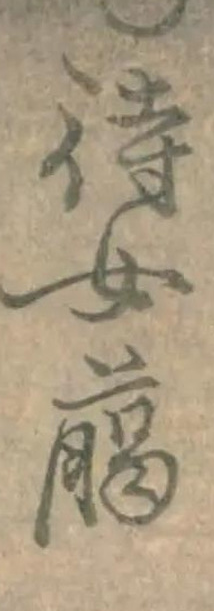待女臈
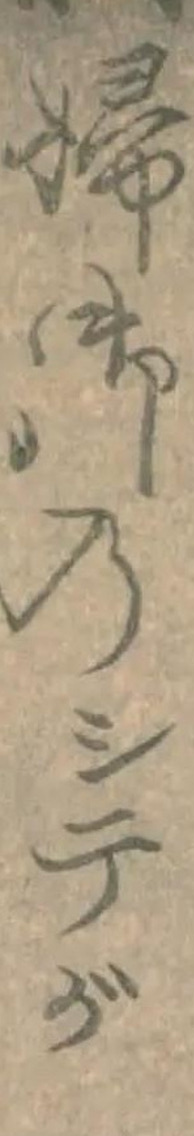婦御のシテが
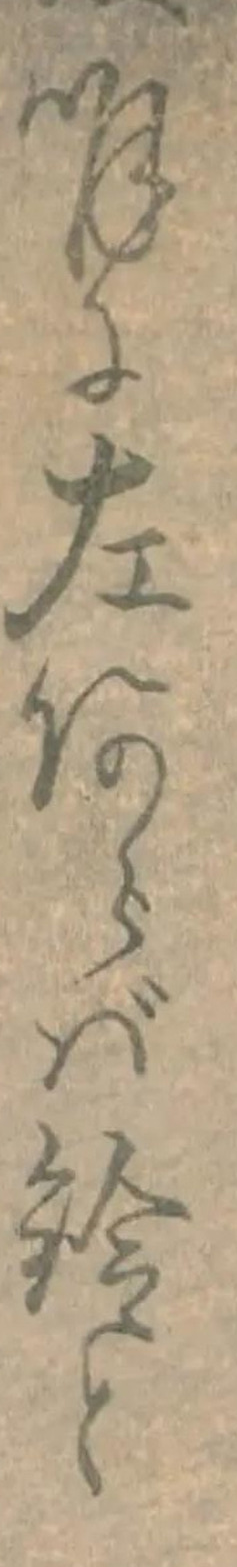に左あらば鈴と
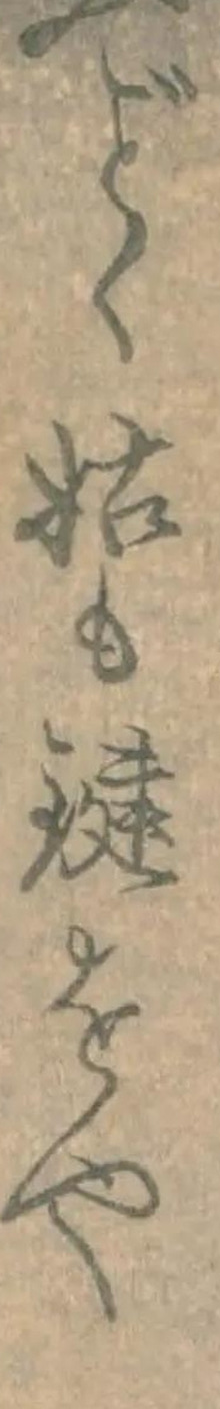ふごとく姑も鍵をや

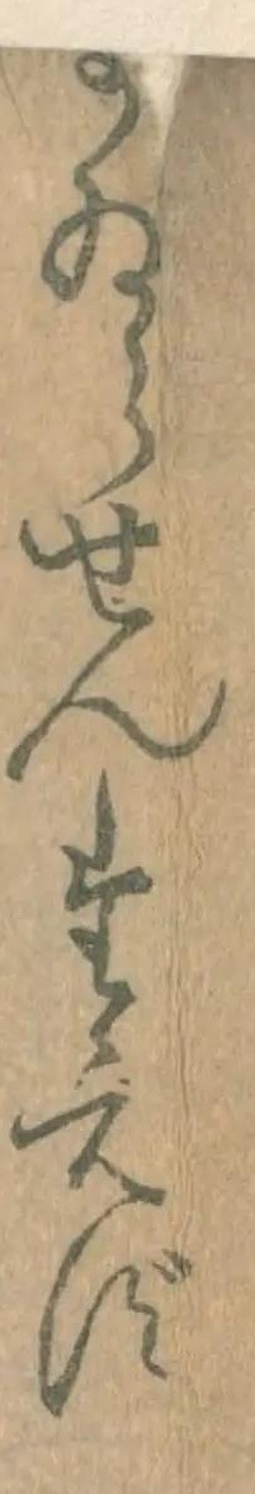ゐらせんたえず
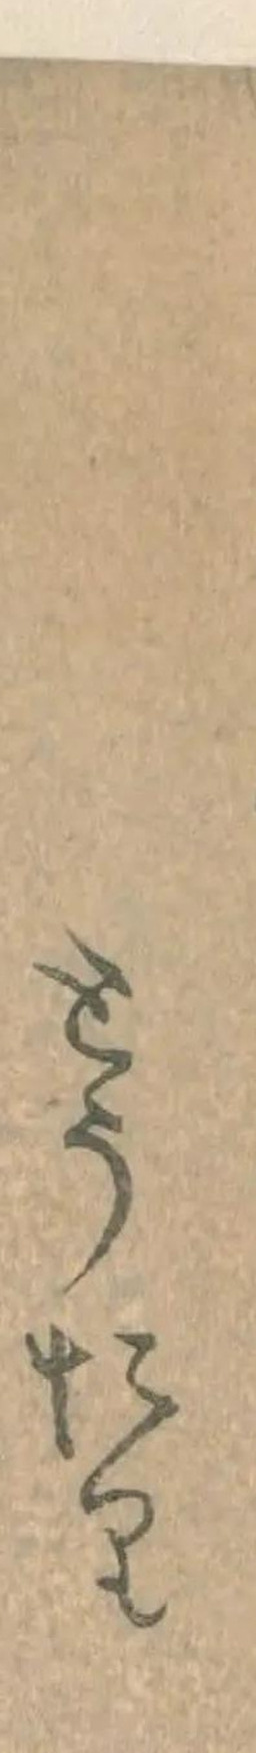とうたり
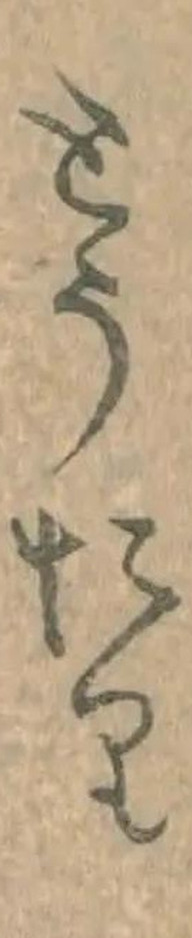とうたり
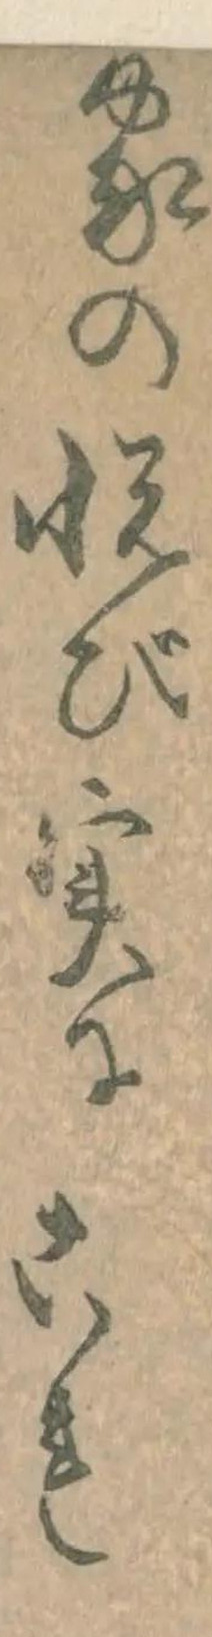家の悦び実にこれ
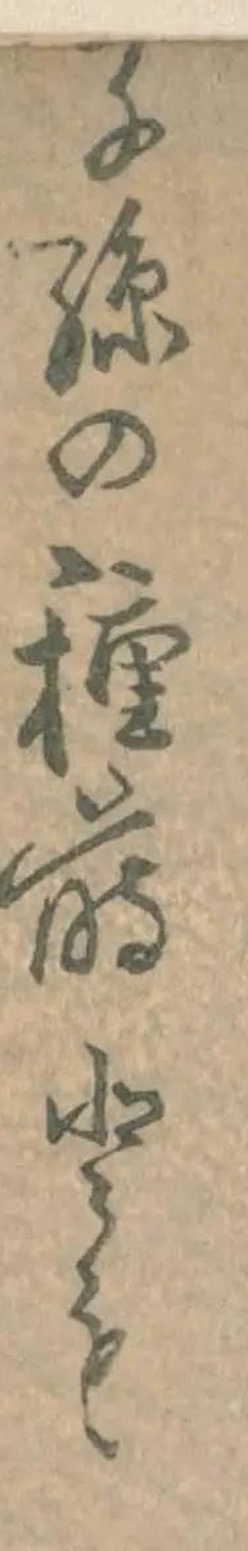子孫の種蒔とも
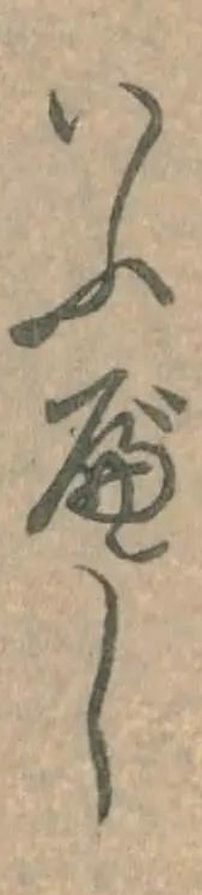いふべし
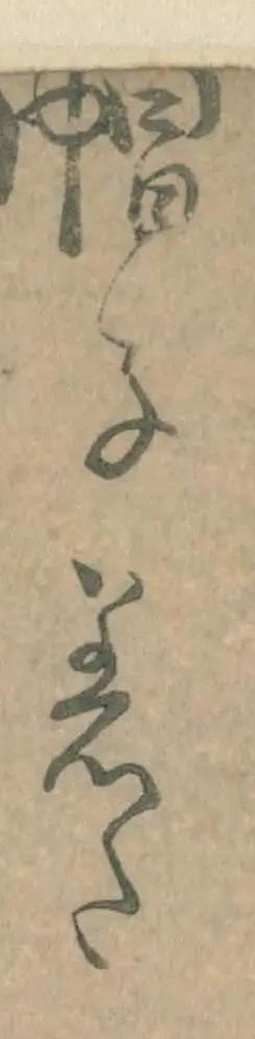帽子着た
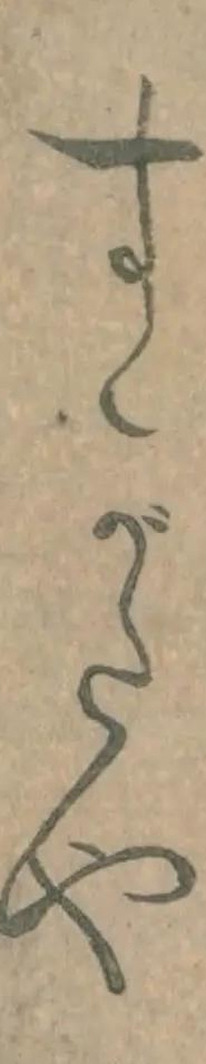すがたや
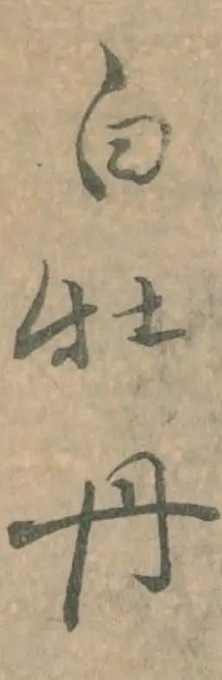白牡丹
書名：国芳国貞錦絵
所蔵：国立国会図書館 National Diet Library, JAPAN
